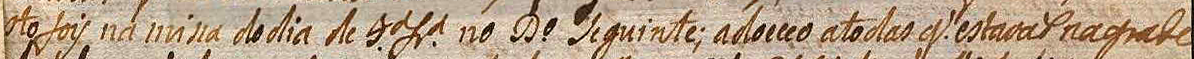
sto foy na missa do dia de 4.a fr.a no D.o seguinte; adoeceo a todas q̄. estavaõ na grade
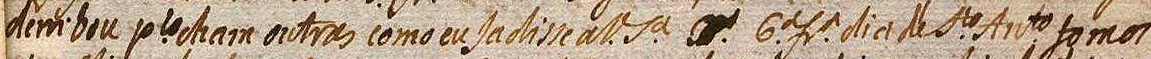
derribou p.lo cham outras como eu Ja disse a V. S.a _ 6.a fr.a dia de S.to Anto fomos
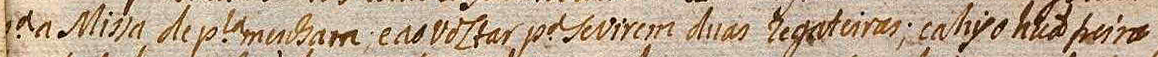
.a a Missa de p.la menham; e ao voltar p.a sevirem duas Regateiras; cahyo huā freira
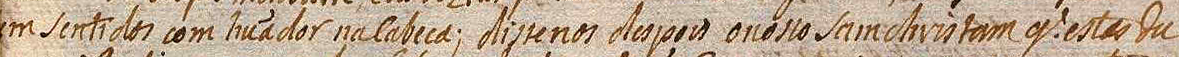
em sentidos com huā dor na Cabeça; dissenos despois o nosso samchristam q̄ estas du
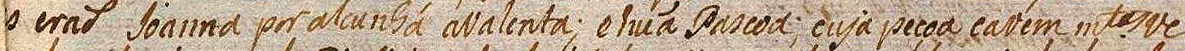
s eraõ Ioanna por alcunha a valenta; e huā Pascoa; cuja peçoa ca vem mtas ve
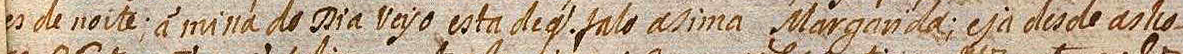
es de noite; á missa do Dia veyo esta de q̄. falo asima Margarida; e ja desde as ho
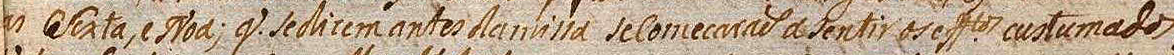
as a Sexta, e Noa; q̄ se dizem antes da missa se comecaraõ a sentir os eff.tos custumados
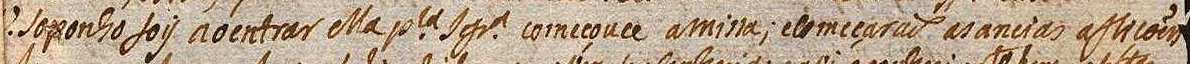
soponho foy ao entrar ella p.la Igr.a começouce a missa; e começaraõ as ancias afliçoẽns
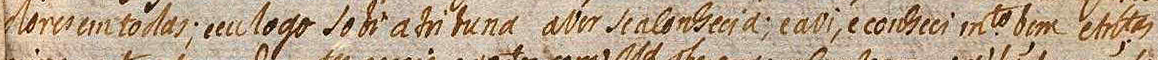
dores em todas; e eu logo sobi a tribuna a ver se a conhecia; e a vi, e conheci m.to bem e m.tas
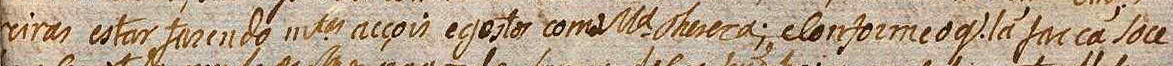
reiras estar fazendo mtas acçois e gestos com a M.a Thereza; e conforme o q̄ lá facçá soce
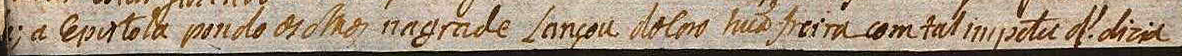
; a Epistola pondo os olhos na grade Lançou do coro huā freira com tal impetu q̄. dizia
